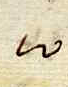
10
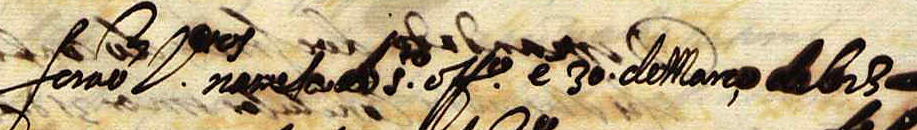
foraõ V.tos na mesa do s.to off.o ē 30 de Março de 613
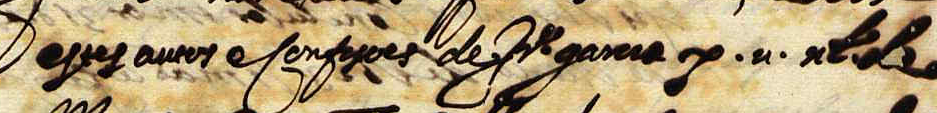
estes autos e Confisoes de fr.co garcia x. n. nl̄ de
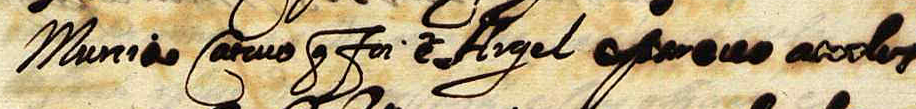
Murcia Catiuo q̄ foi ē Argel e pareceo a todos
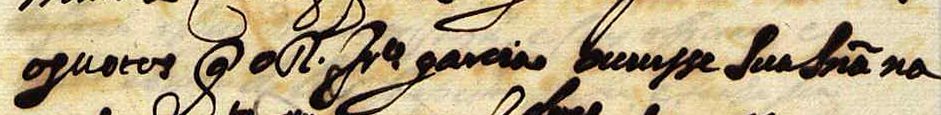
os uotos q̄ o R. frco. garcia ouuisse sua snā na
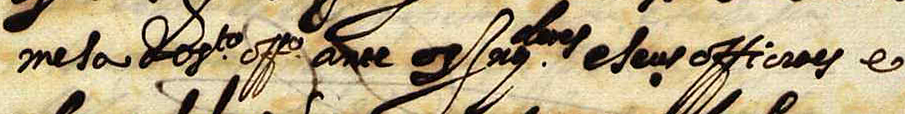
mesa do s.to offo. ante os Jnq.dores e seus officiaes e
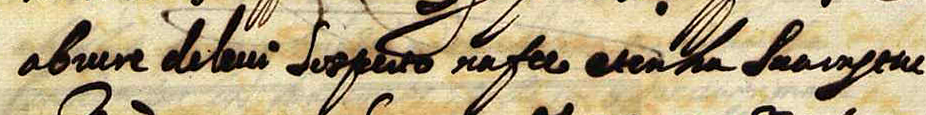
abiure de leui sospeito na fee e tenha sua instru
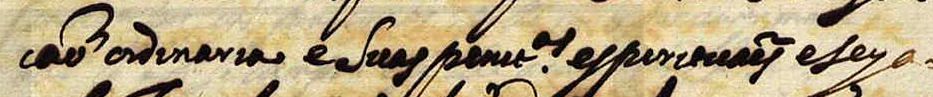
çaõ ordinaria e suas penit.as espirituaēs e seya
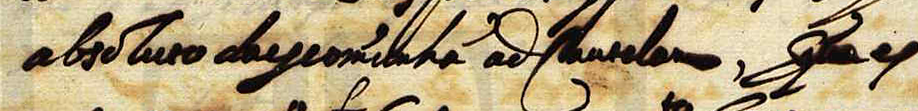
absoluto da escom̄unhā ad Cautelam, E que ua es
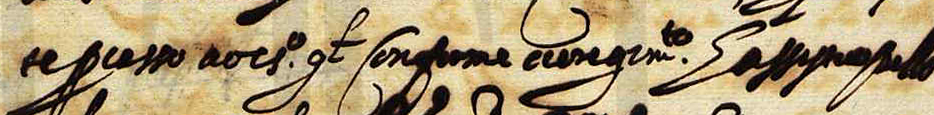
te ꝓcesso ao cs.o gl̄ Conforme ao regim.to E assiste pello
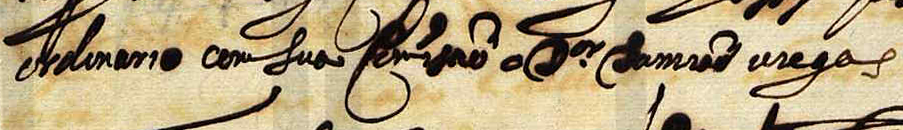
ordinario com sua Comīsaõ o D.or Damiaõ uiegas
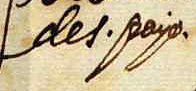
de s. payo.
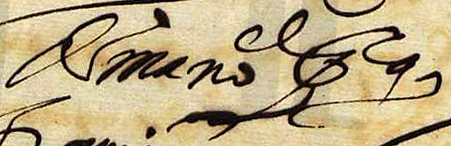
manoel pra
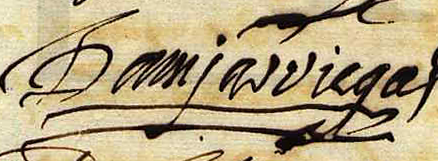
Damjaõ viegas
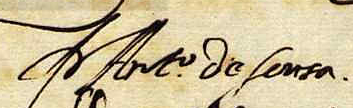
fr Ant.o de sousa.
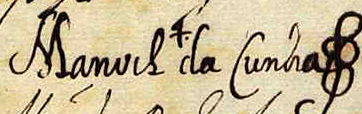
Manoel da Cunha
